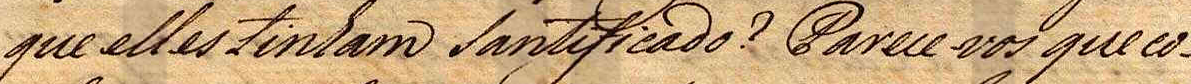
que elles tinham Santificado? Parece vos que co
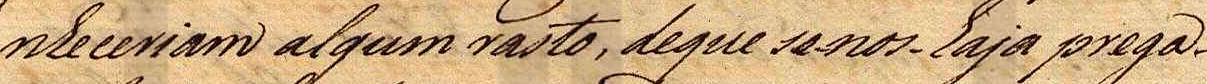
nheceriam algum rasto, de que se-nos-haja prega
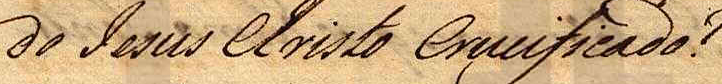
do Iesus Christo Crucificado?
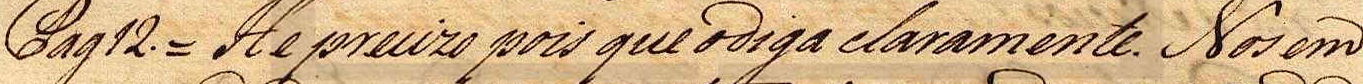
Pag 12. = He precizo pois que o diga claramente. Nos em
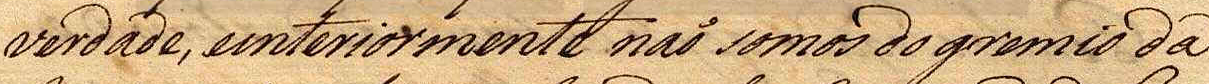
verdade, e interiormente naõ somos do gremio da
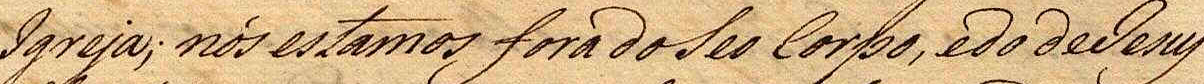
Igreja; nós estamos fora do Seo Corpo, e do de Iesus
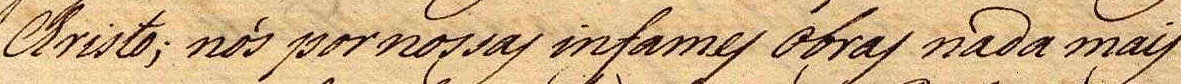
Christo; nós por nossas infames obras nada mais
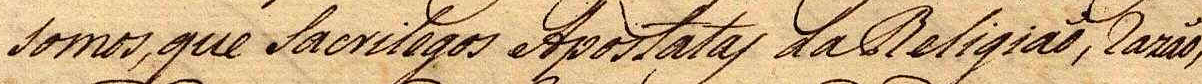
somos, que Sacrilegos Apostatas da Religiaõ, Razaõ,
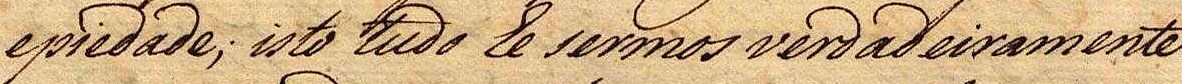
e piedade; isto tudo he sermos verdadeiramente
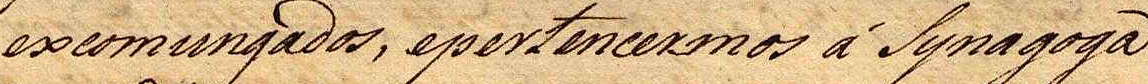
excomungados, e pertencermos á Synagoga
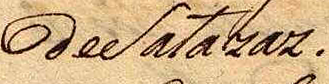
de Satazaz.
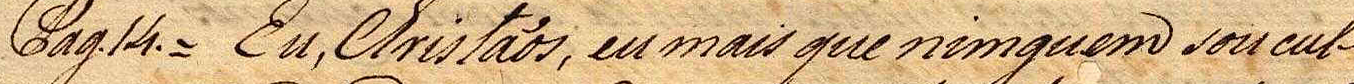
Pag. 14. = Eu, Christaõs, eu mais que nimguem sou cul
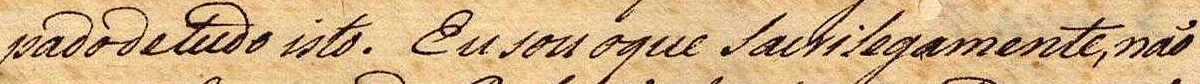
pado de tudo isto. Eu sou o que Sacrilegamente, naõ
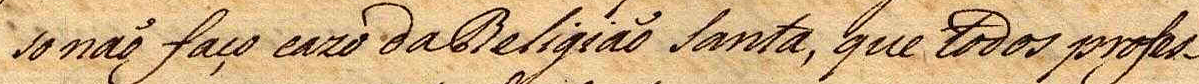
so naõ faço cazo da Religiaõ Santa, que todos profes
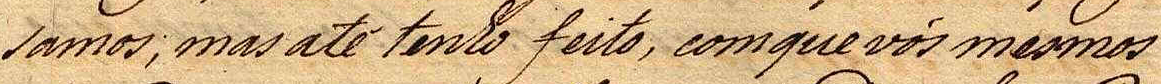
samos; mas até tenho feito, com que vós mesmos
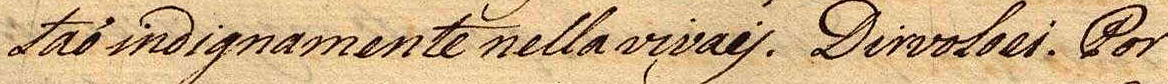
taõ indignamente nella vivais. DirvoLoei. Por
